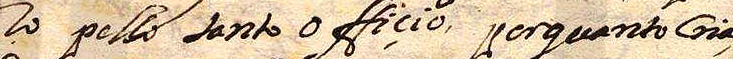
zo pello santo offiçio, porquanto Cria,
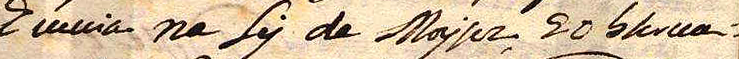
E ueuia na Lej de Moysez, E obserua
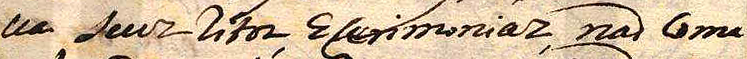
ua seuz ritoz, E Cerimoniaz, naõ come
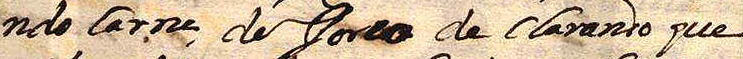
ndo Carne, de Porco deClarando que
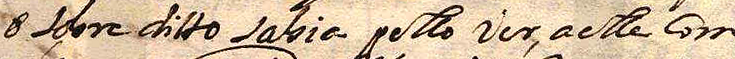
o sobreditto sabia pello ver, a elle com
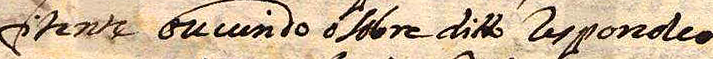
fitente ouuindo o sobreditto Respondeo
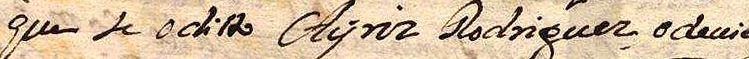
que se o ditto Ayriz Rodriguez, o deuia
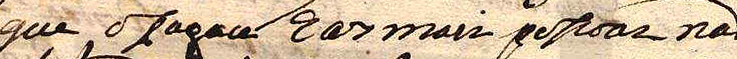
que o pagace E as maiz pessoaz naõ
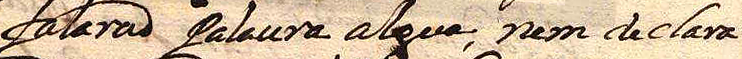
falaraõ palaura algua, nem declara
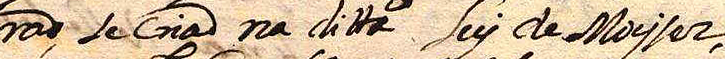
raõ, se criaõ na ditta Ley de Moysez,
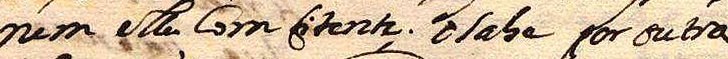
nem elle Comfitente; e sabe por outra
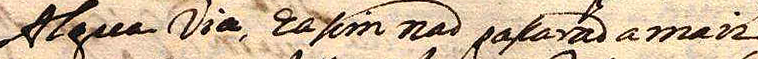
Algua Via, E asim naõ passaraõ a maiz,
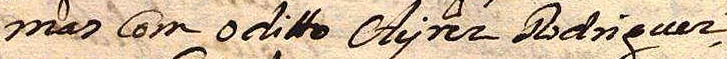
mas com o ditto Ayrez Rodriguez,
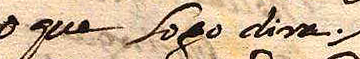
o que Logo dira.
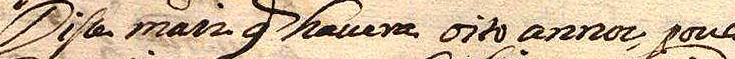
Disse maiz q̄ hauera oito annoz, pouco
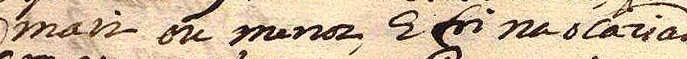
maiz ou menoz, E foi na ocaziaõ
